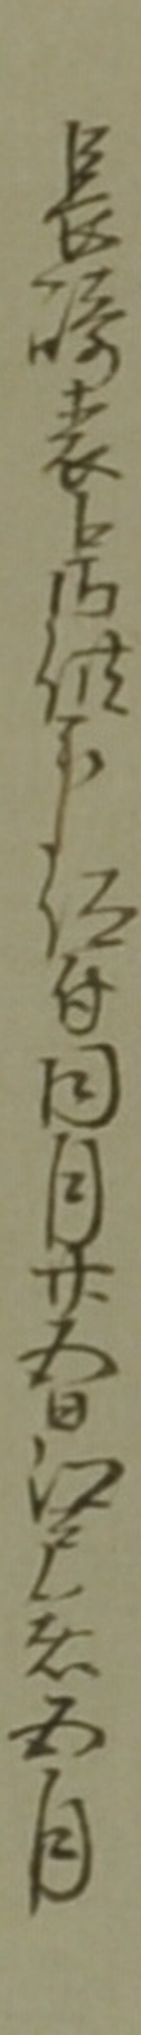長崎表江御供被仰付同月廿五日江戸着五月
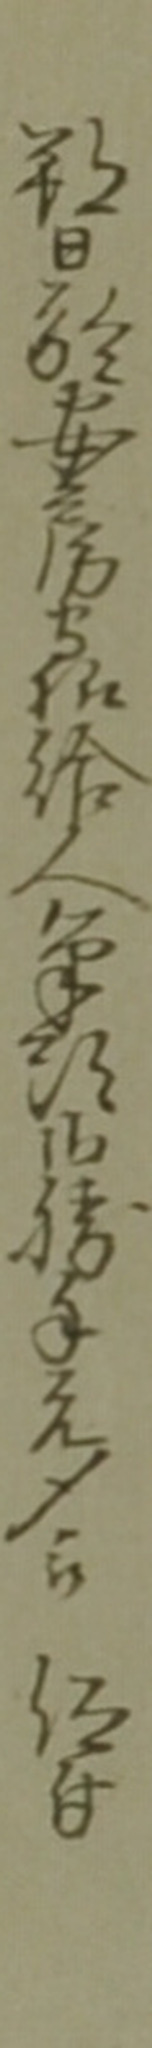朔日於安房守様給人筆頭御勝手元〆被仰付
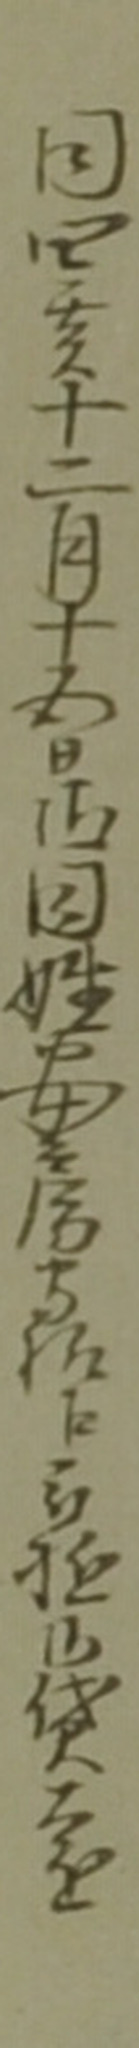一同四亥十二月十五日御同姓安房守様江被遊御貸遠
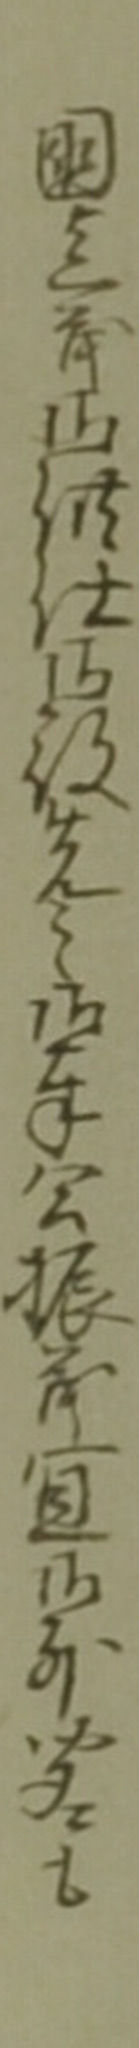国迄茂御供仕御役先之御奉公振茂宜御外聞ニも
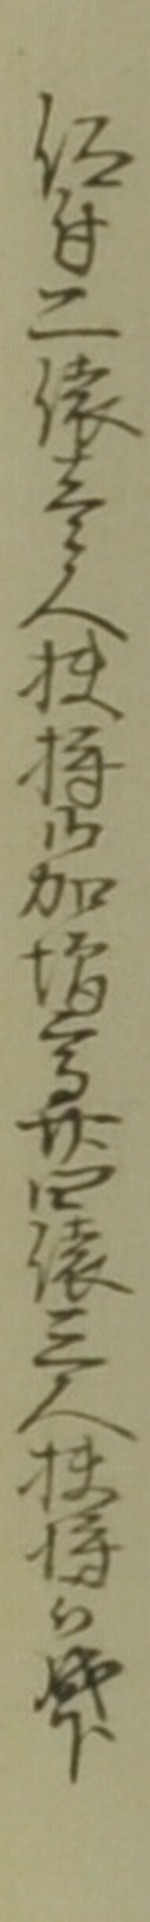仰付二俵壱人扶持御加増高廿四俵三人扶持被成下
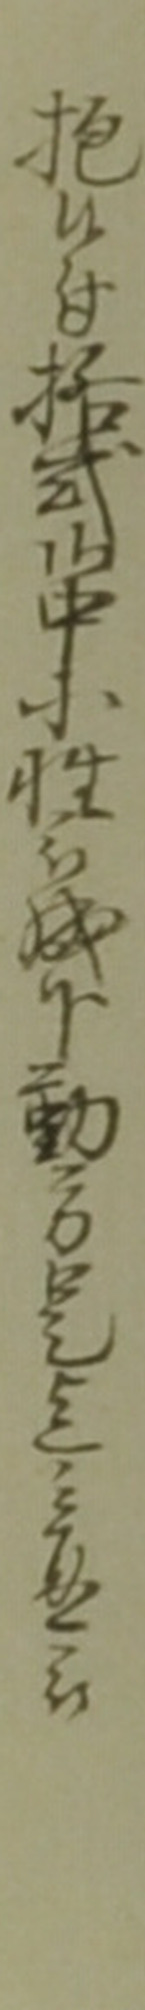抱候付格式御中小性被成下勤方是迄之通被

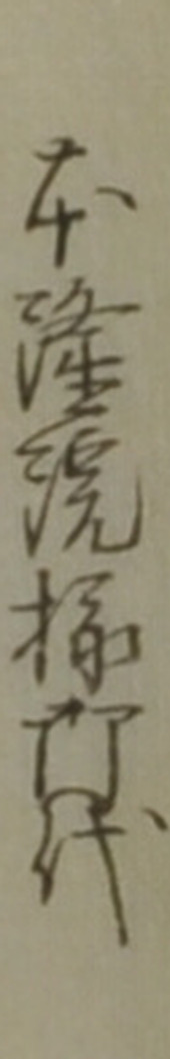本隆院様御代
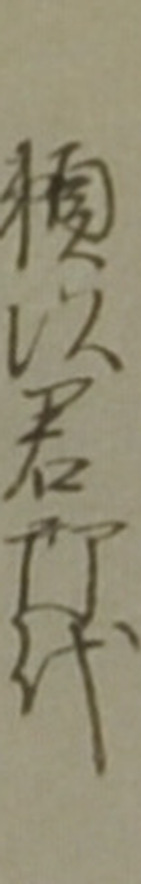頼以君御代
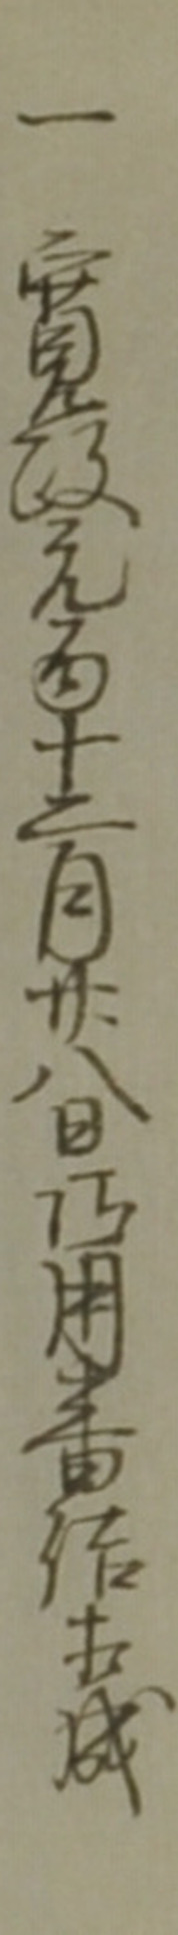一寛政元丙十二月廿八日御用番詰相成
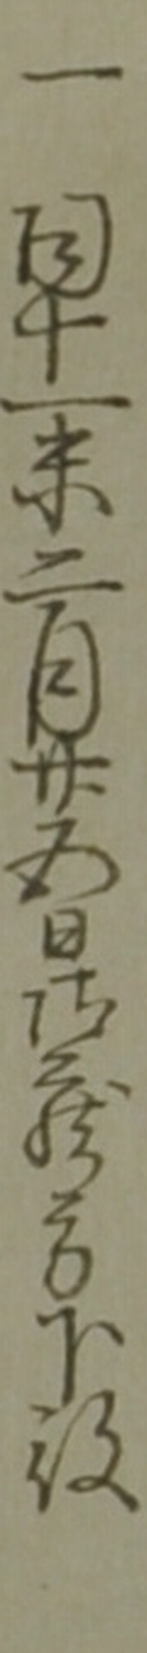一同十一未二月廿五日御蔵方下役
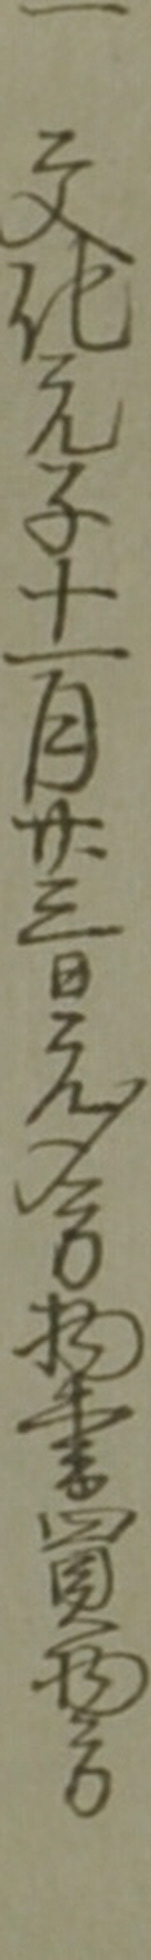一文化元子十一月廿三日元〆方物書買物方
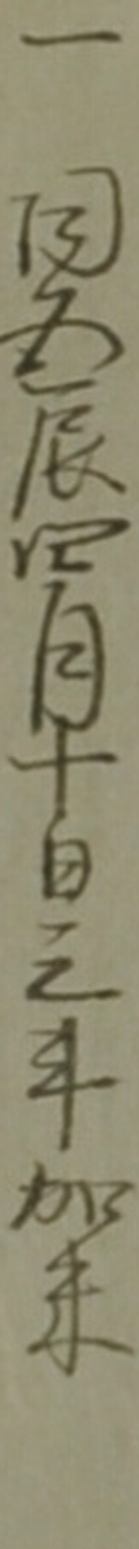一同五辰四月十日三年加米
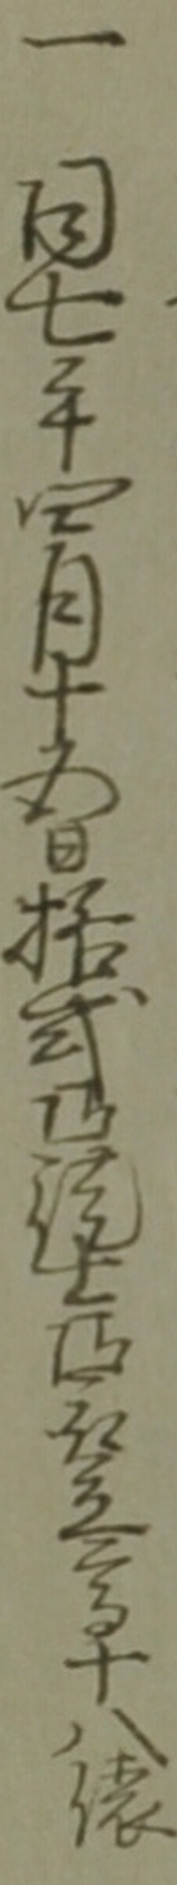一同七午四月十五日格式御徒士御取立高十八俵
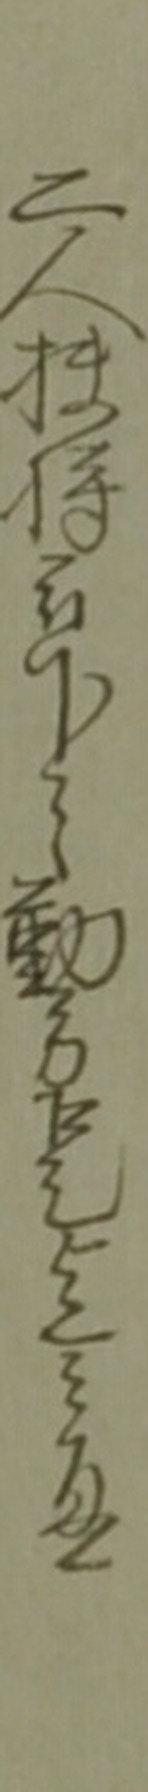二人扶持被下之勤方是迄之通
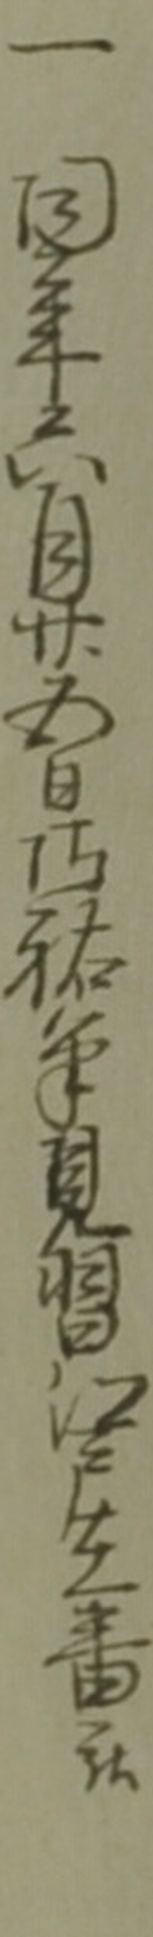一同年六月廿五日御祐筆見習江戸在番被

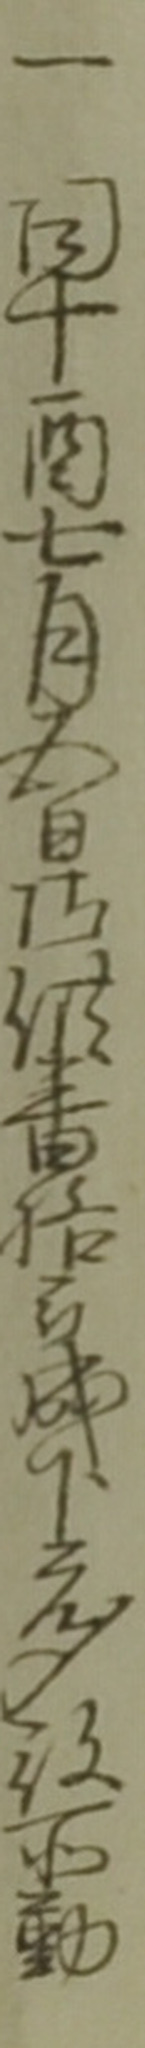一同十酉七月五日御供番格被成下元〆役所勤
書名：無足諸士勤仕録（五）
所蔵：伊那市立高遠町図書館・合同会社AMANE
